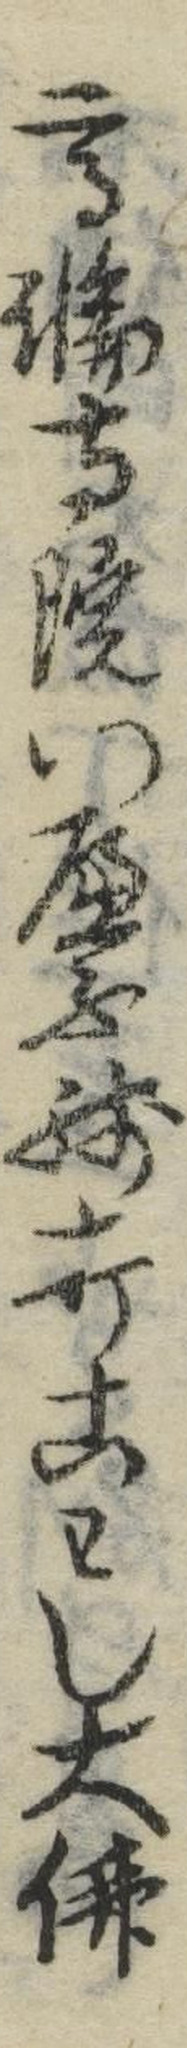高輪寺院門壁不残打こわし大仏
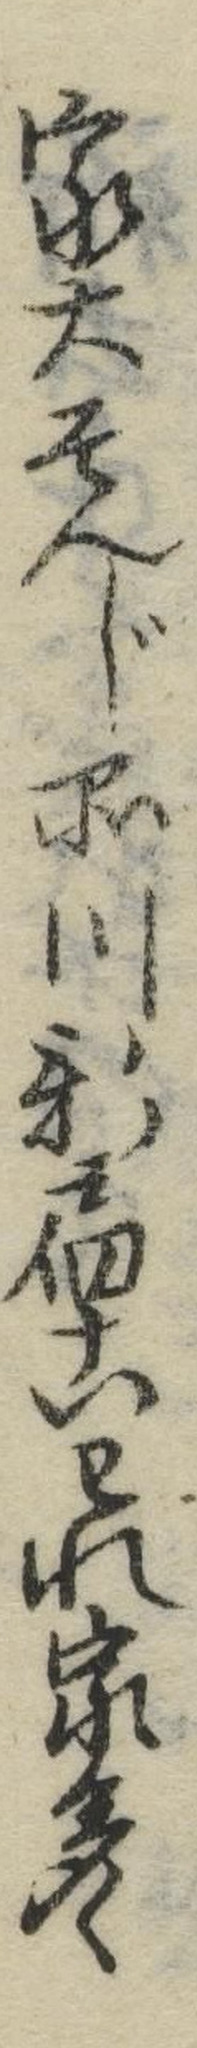家大そんじ品川新佃こわれ家多く
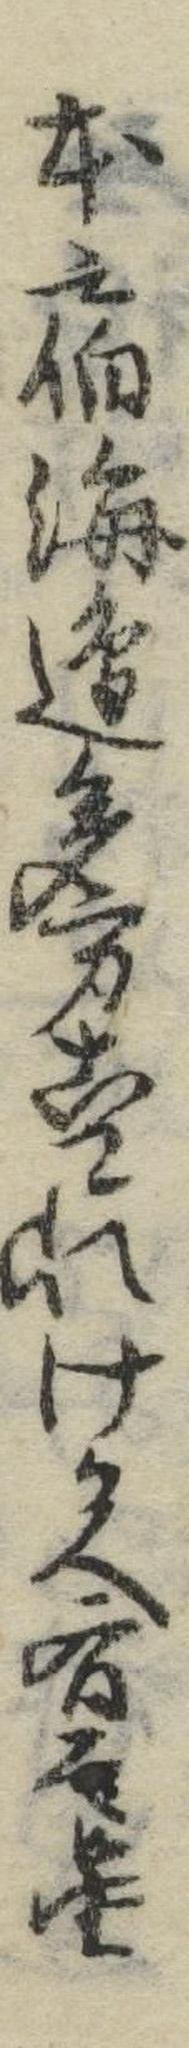本佃海辺多方こわれけか人有之候由
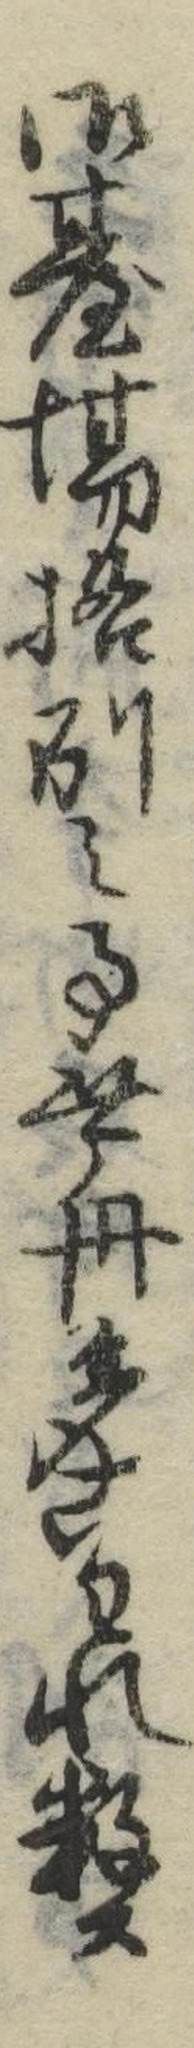御台場格別之事無舟多こわれ数ㇲ
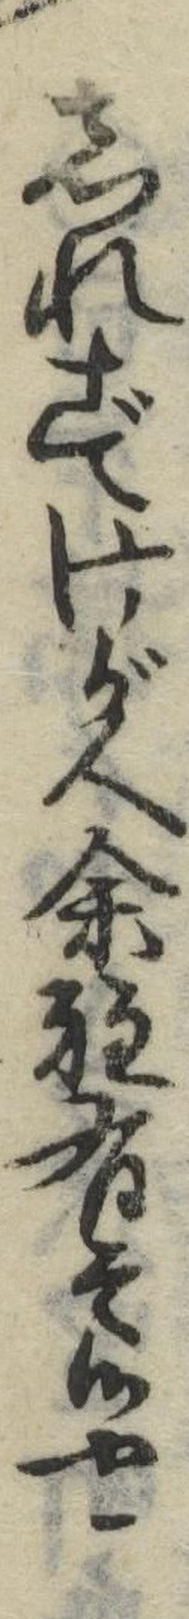しれずけが人余程有之候由

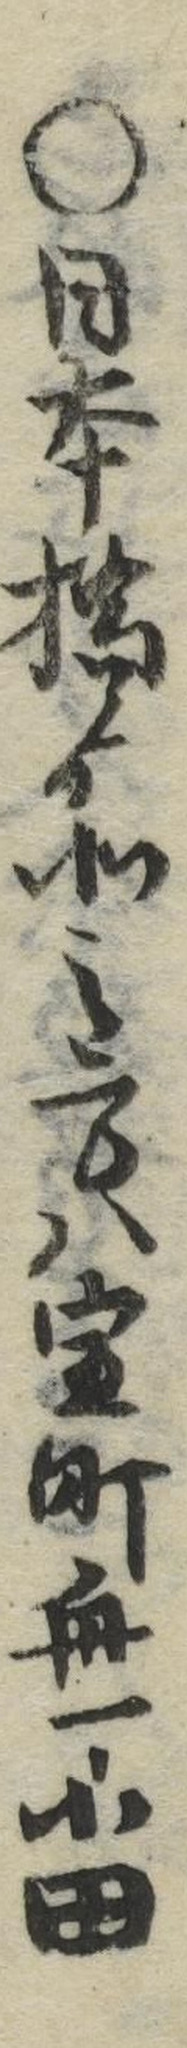○日本橋より北之方ハ宝町舟丁小田
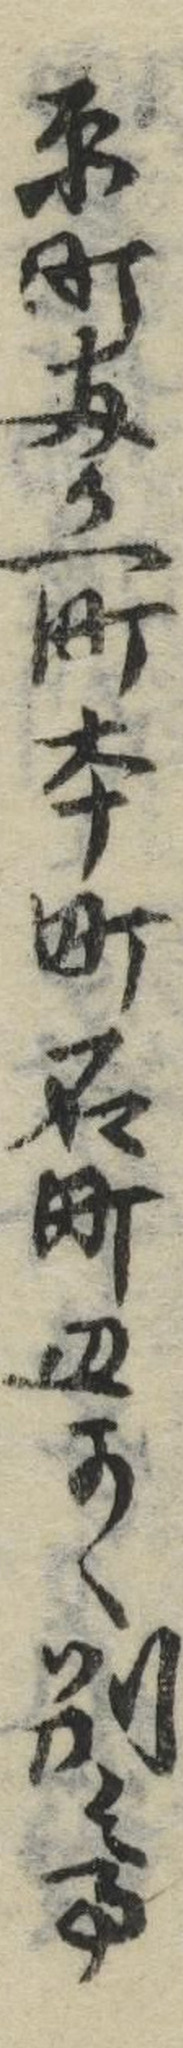原町両かへ町本町石町辺かく別之事
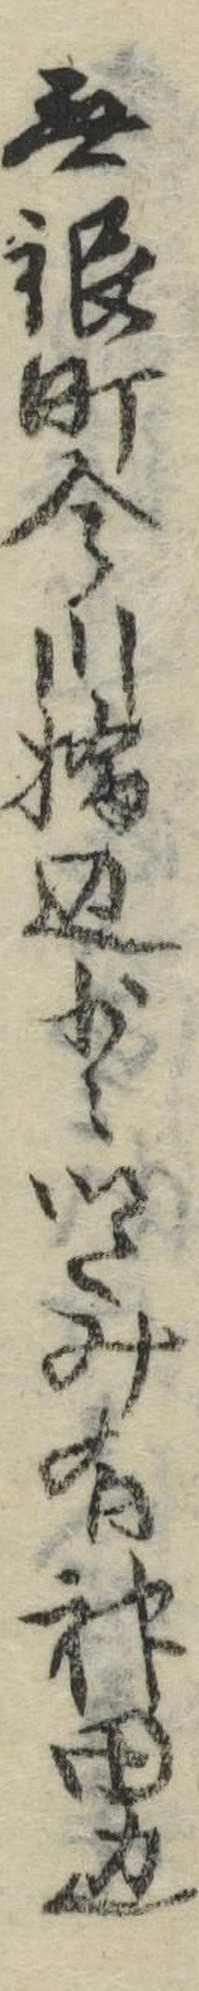無銀町今川橋辺少々いたみ有神田辺
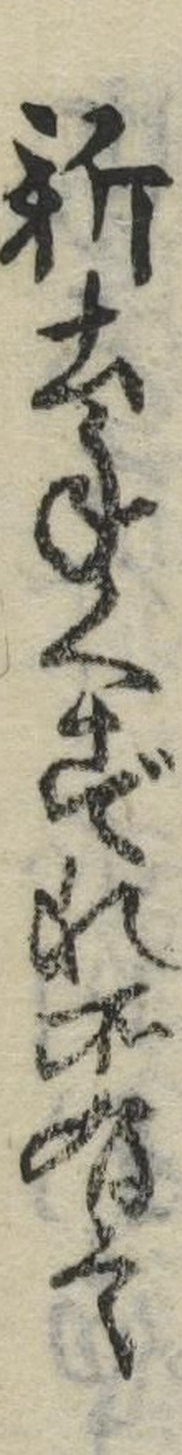新土手くずれ所有之
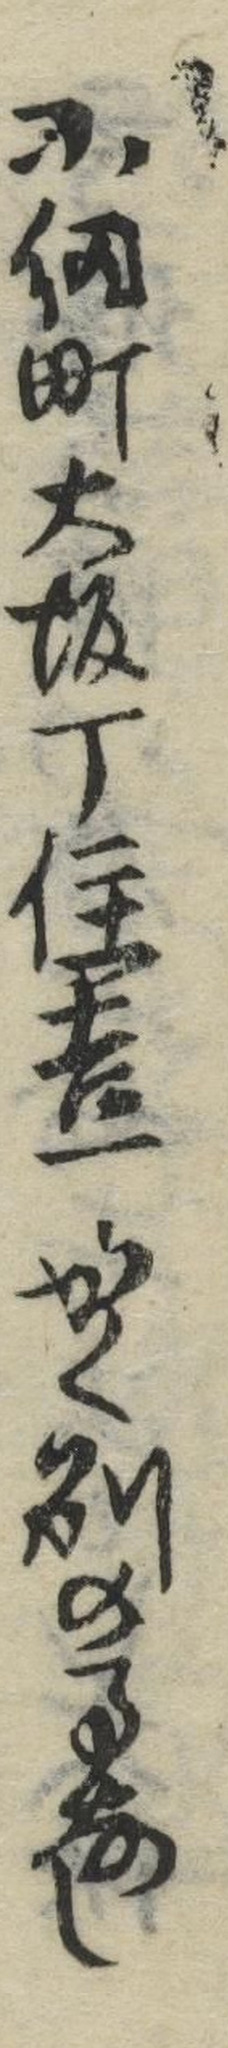小佃町大坂丁住吉丁かく別の事なし
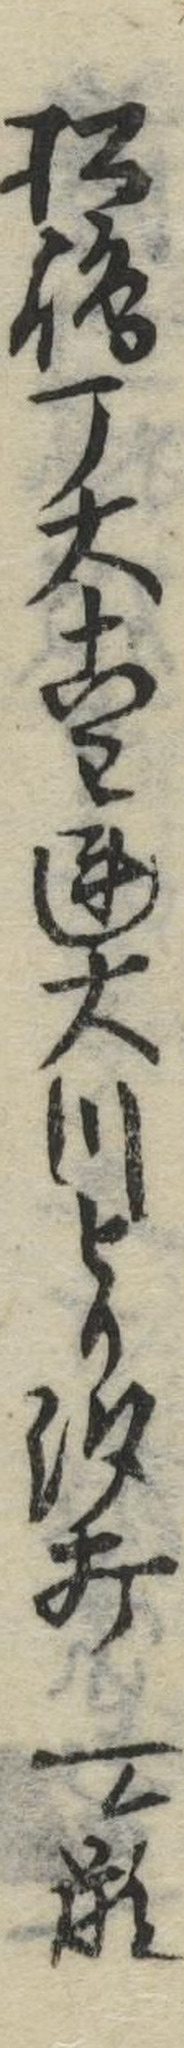松嶋丁大こわれ大川より汐打亡類
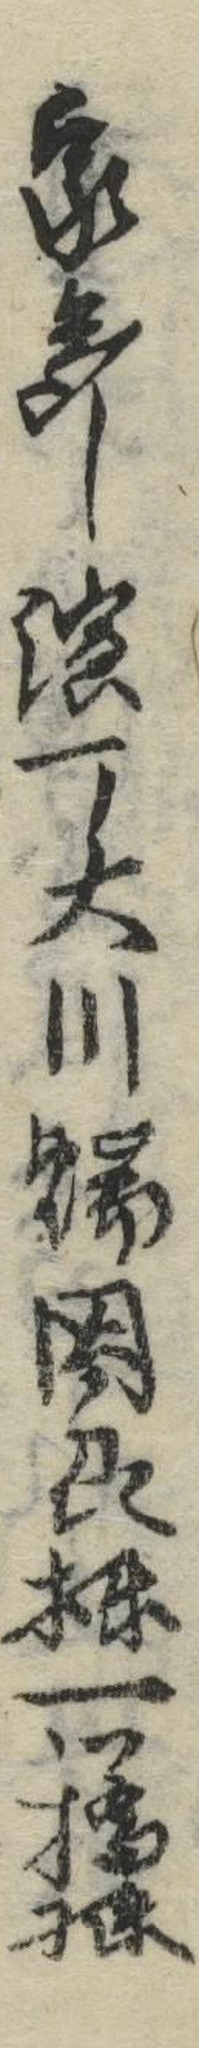家多し濱丁大川端因州様一つ橋様
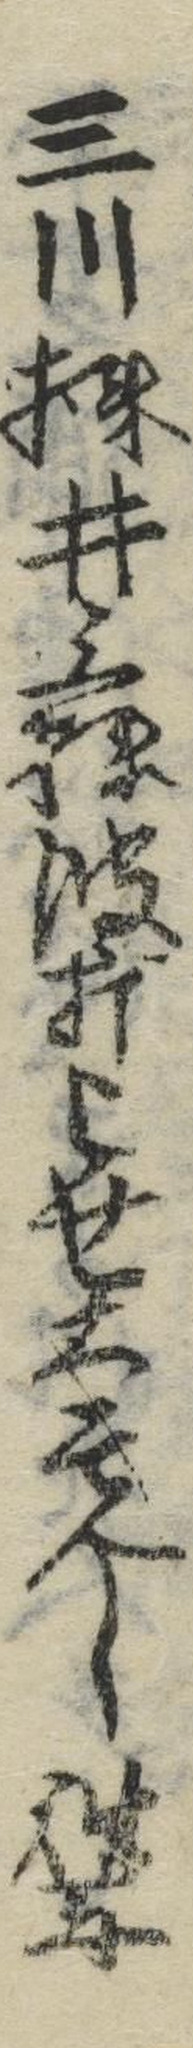三川様井上様波打よせ大そんし往来
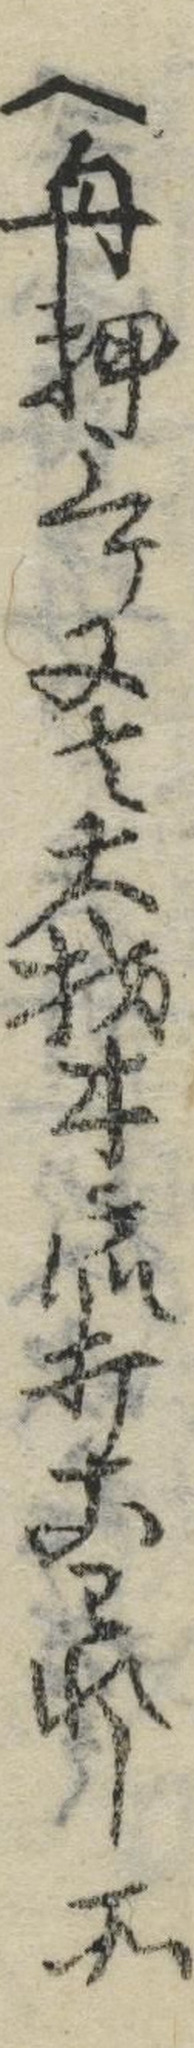へ舟押上ケ又は大材木流打こわれし所
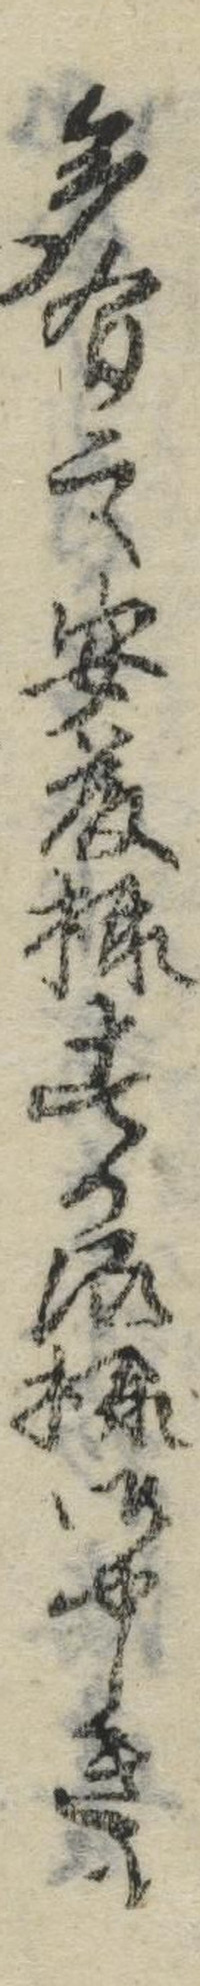多有之安藤様すか沼様御やしき
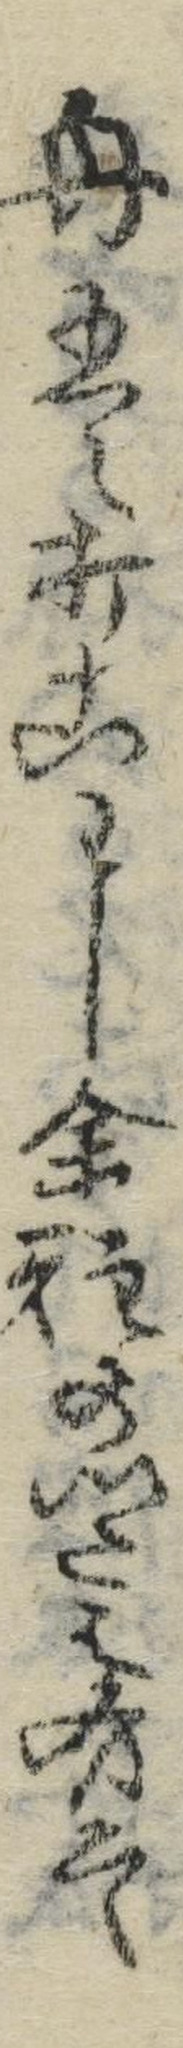舟出し打こわし余程のいたみ有之
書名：安政三年辰八月廿五日夜　大江都御屋敷方寺社市中共　大嵐水入場所明細書之寫　并街道筋近郷聞書
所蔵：東京大学地震研究所図書室 Earthquake Research Institute Library, The University of Tokyo, JAPAN
